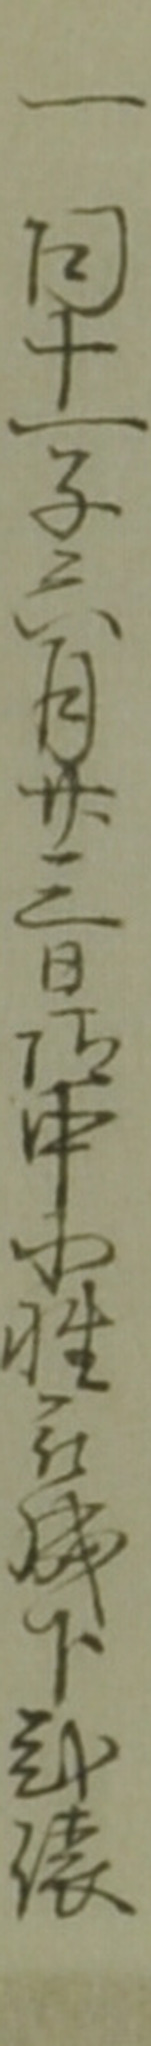一同十一子六月廿三日御中小性被成下弐俵
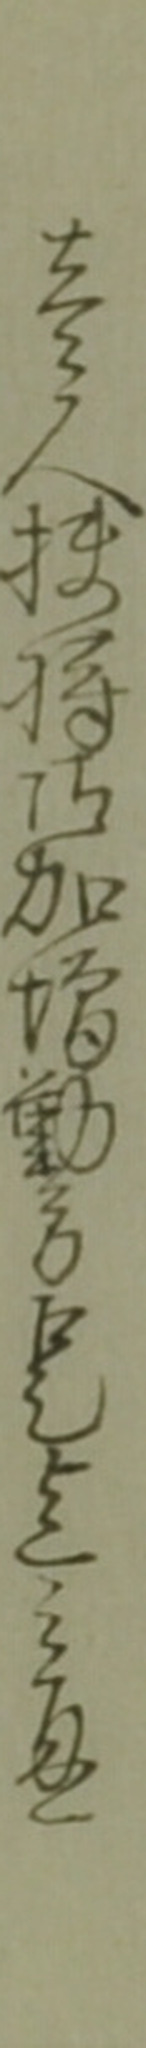壱人扶持御加増勤方是迄之通
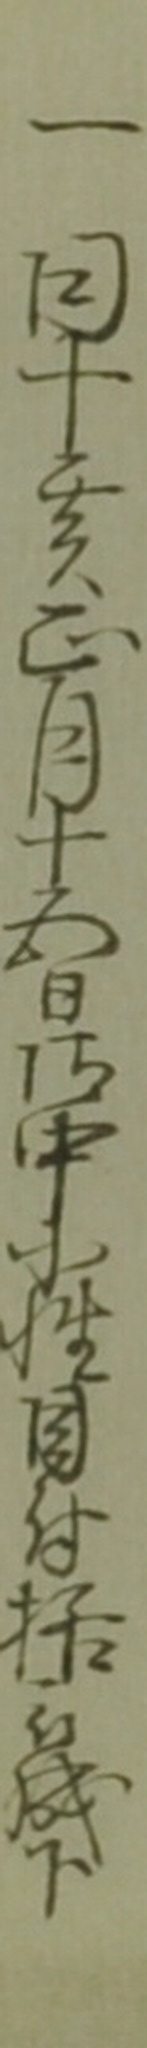一同十亥正月十五日御中小性目付格被成下
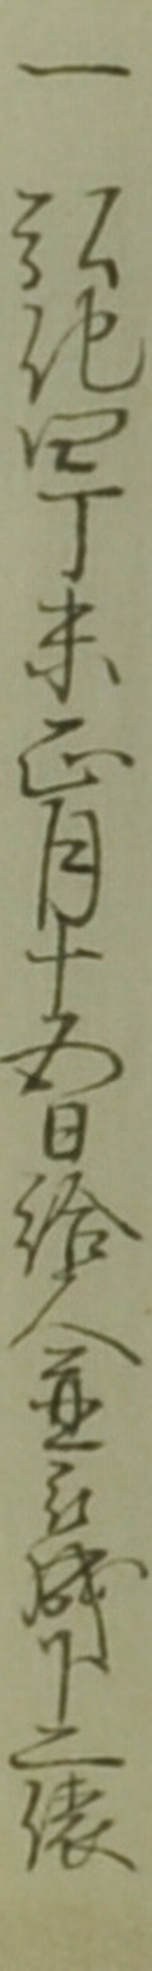一弘化四丁未正月十五日給人並被成下二俵
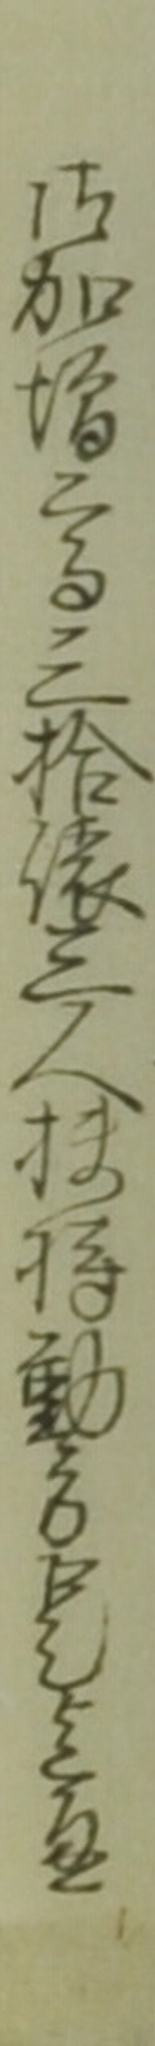御加増高三拾俵三人扶持勤方是迄通
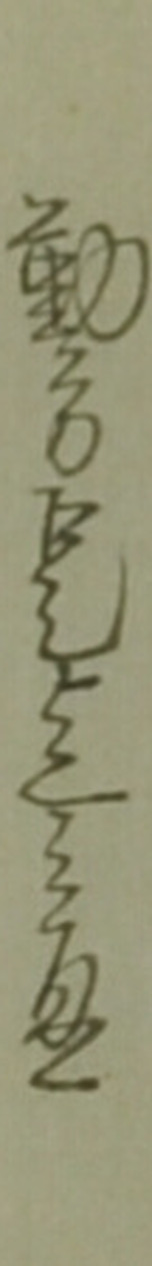勤方是迄之通

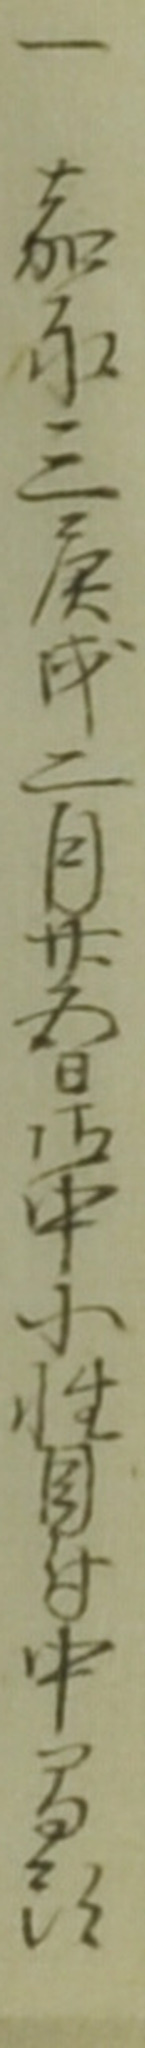一嘉永三庚戌二月廿五日御中小性目付中間頭
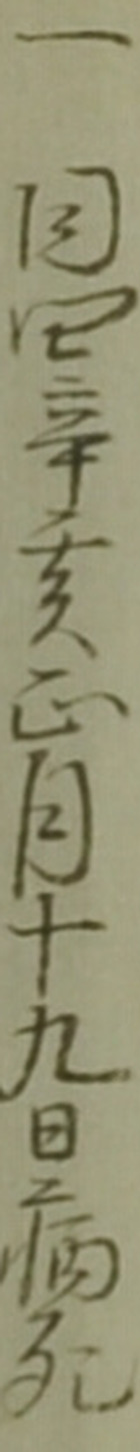一同四辛亥正月十九日病死
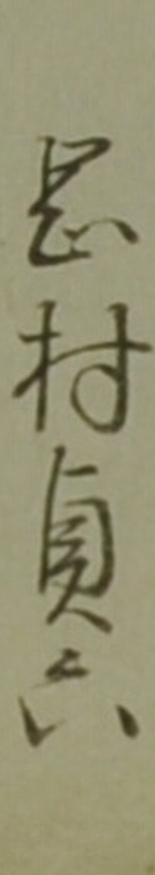岡村貞六
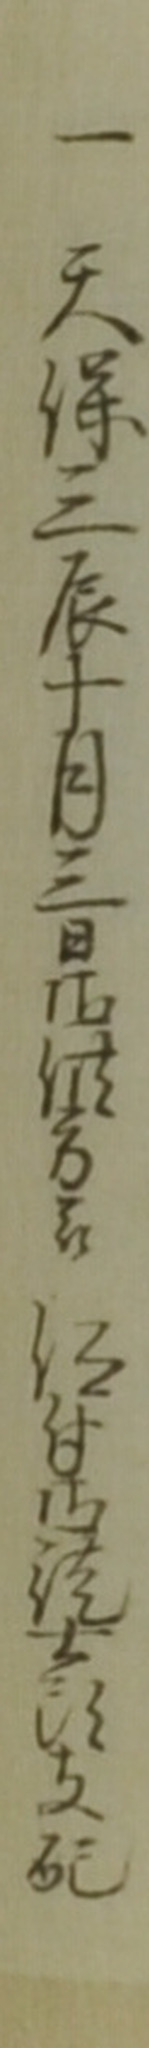一天保三辰十月三日御供方被仰付御徒士頭支配
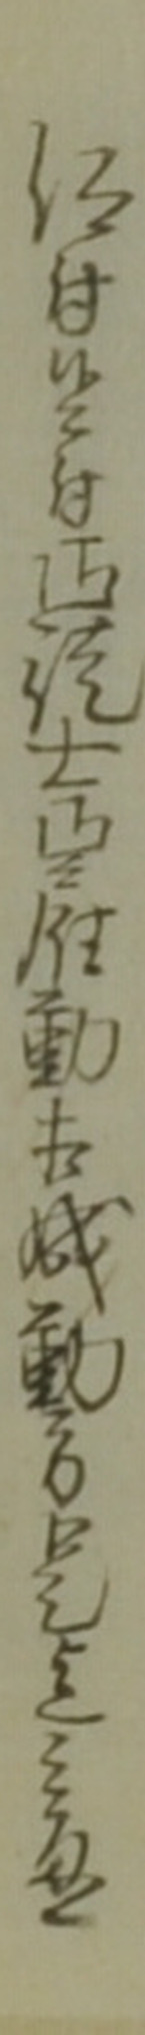仰付候ニ付御徒士御雇勤相成勤方是迄之通
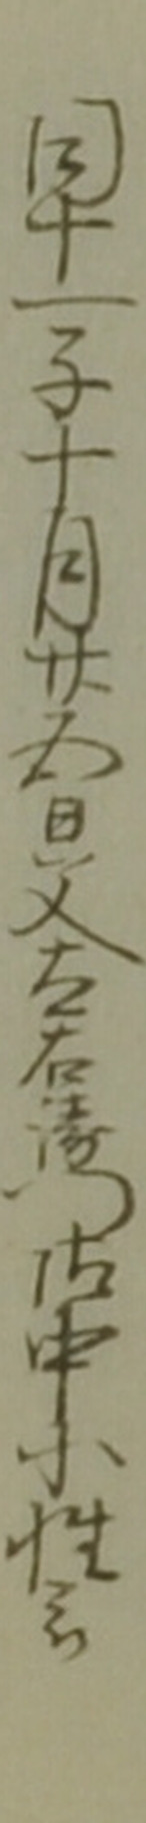一同十一子十月廿五日父太右衛門御中小性被
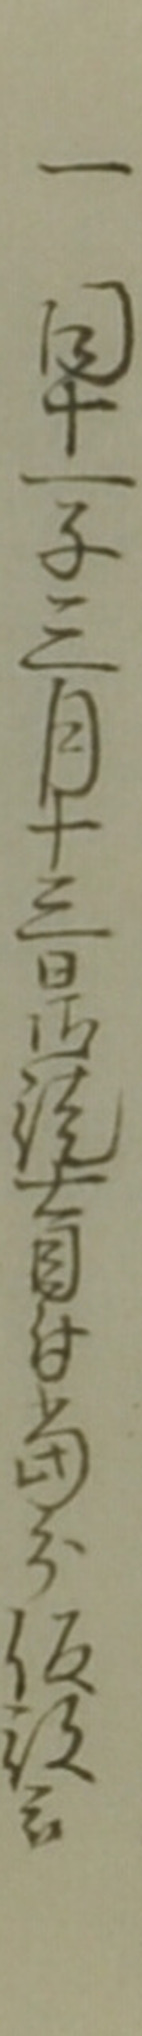一同十一子三月十三日御徒士目付当分仮役被
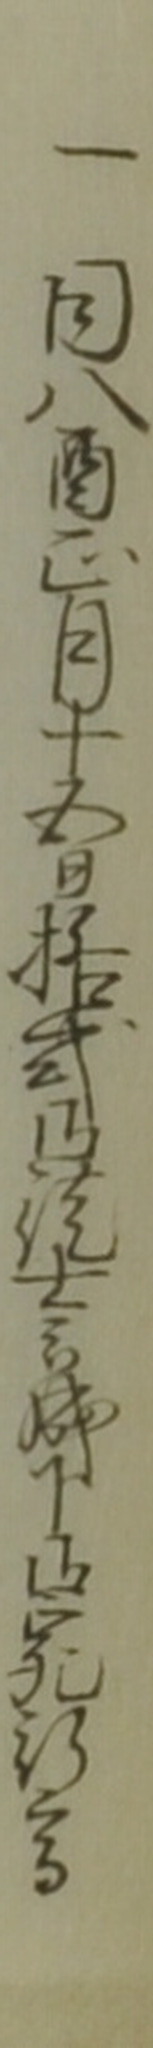一同八酉正月十五日格式御徒士被成下御宛行高
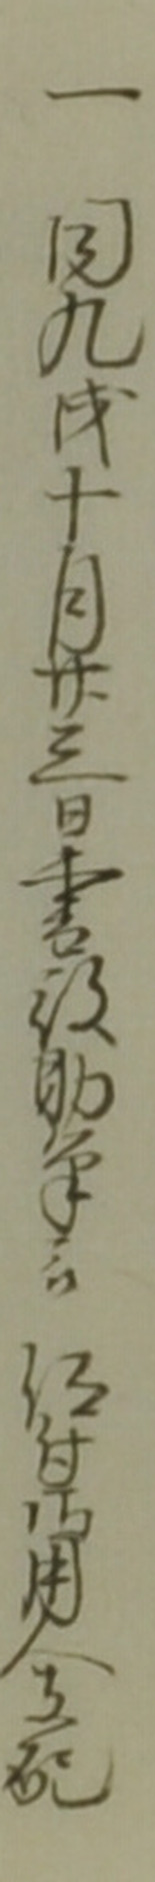一同九戌十月廿三日書役助筆被仰付御用人支配
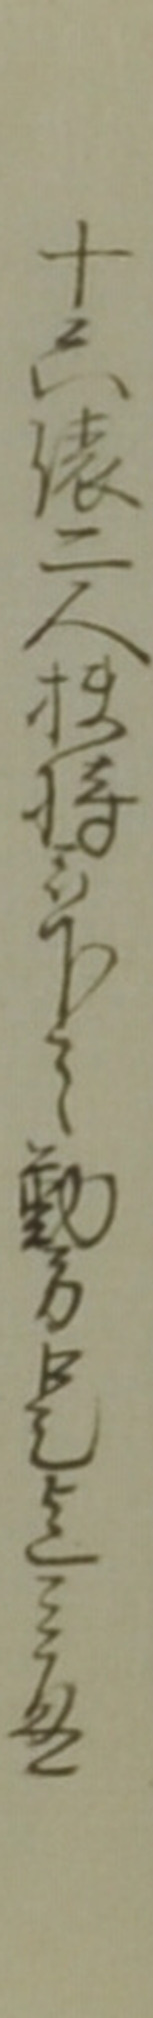十六俵二人扶持被下之勤方是迄之通
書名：無足諸士勤仕録（一）
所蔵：伊那市立高遠町図書館・合同会社AMANE
